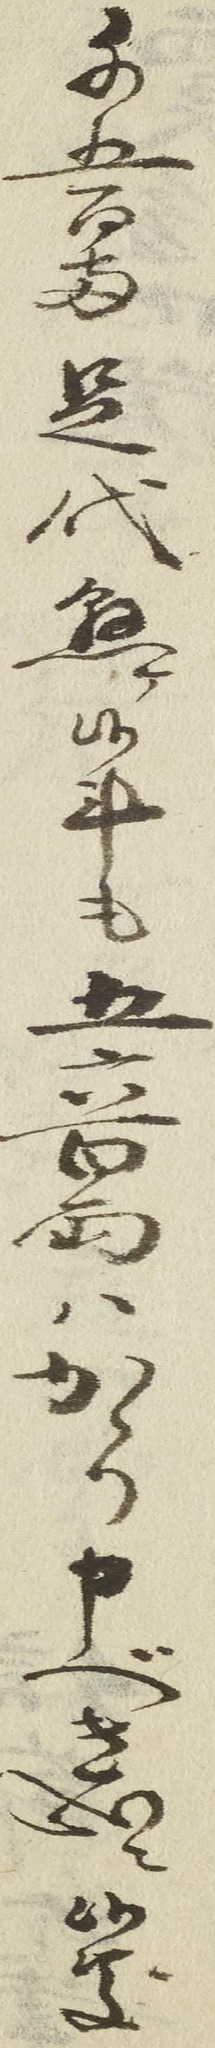千五百両足代懸ケ候計も五六百両はかゝり申べき哉ニ候処
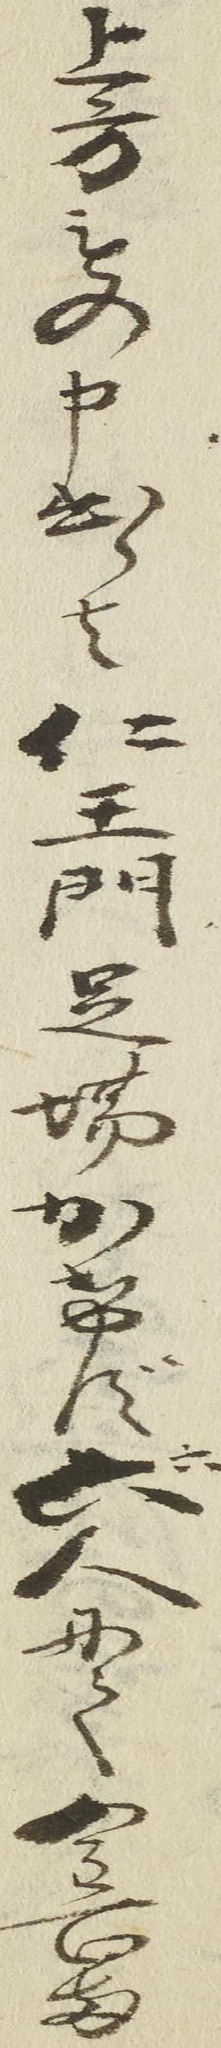上方もの申出候は仁王門足場かけず六人にて金百両
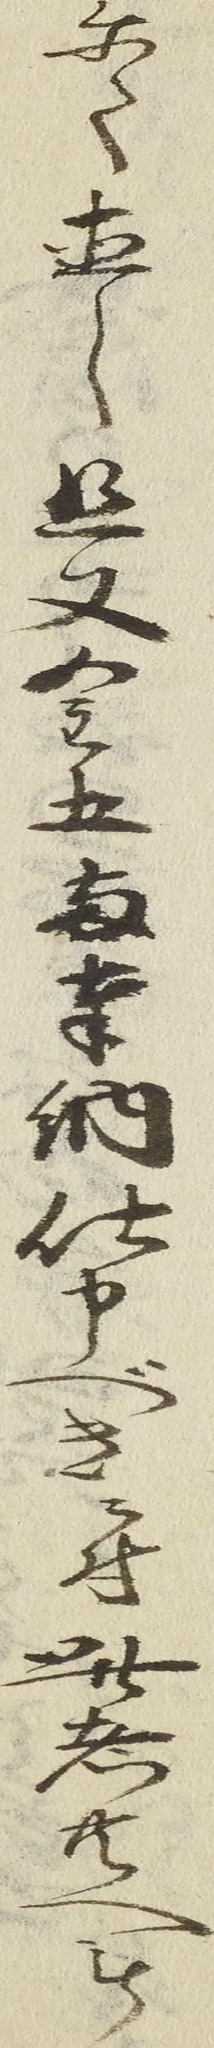にて直し且又金五両奉納仕申べきニ付此者共へ被
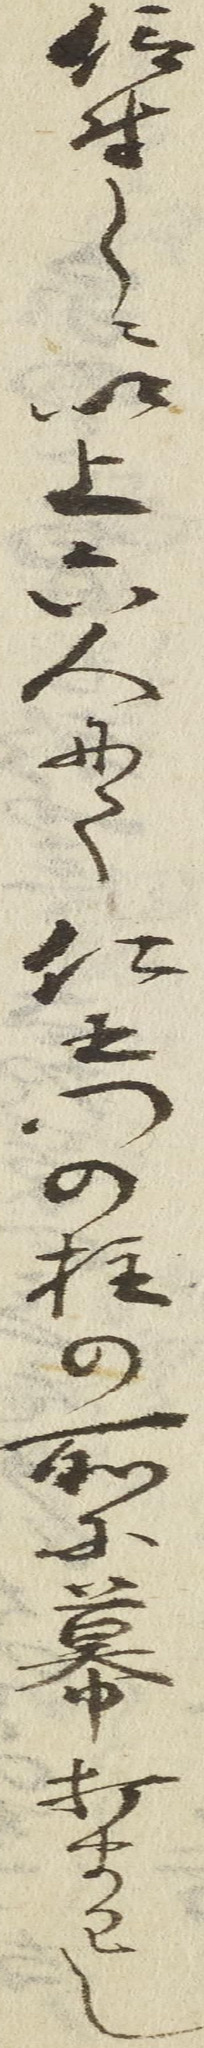仰付しニ以上六人にて仁王門の柱の所に幕打まわし
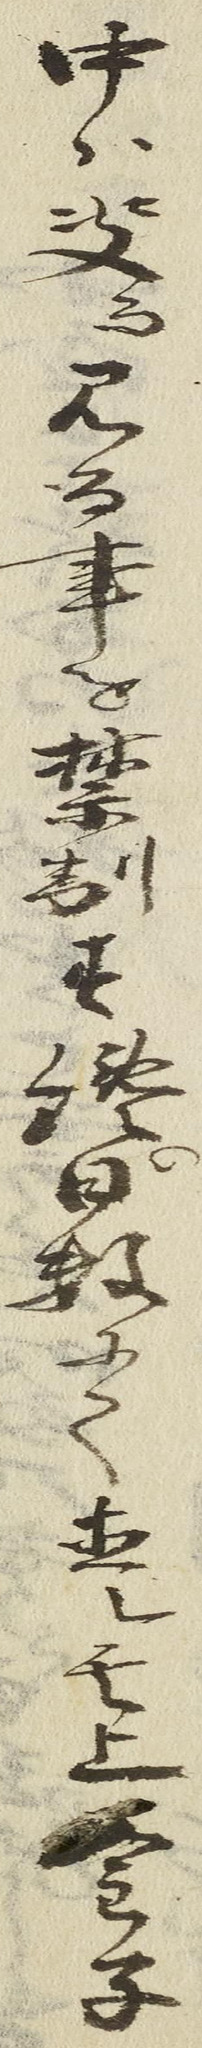中は決而見る事を禁制す纔日数にて直し其上金子
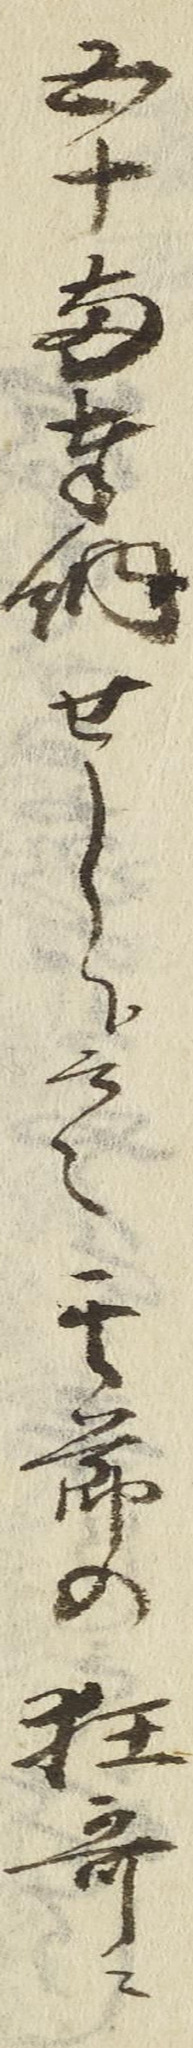五十両奉納せしト云々其節の狂歌ニ
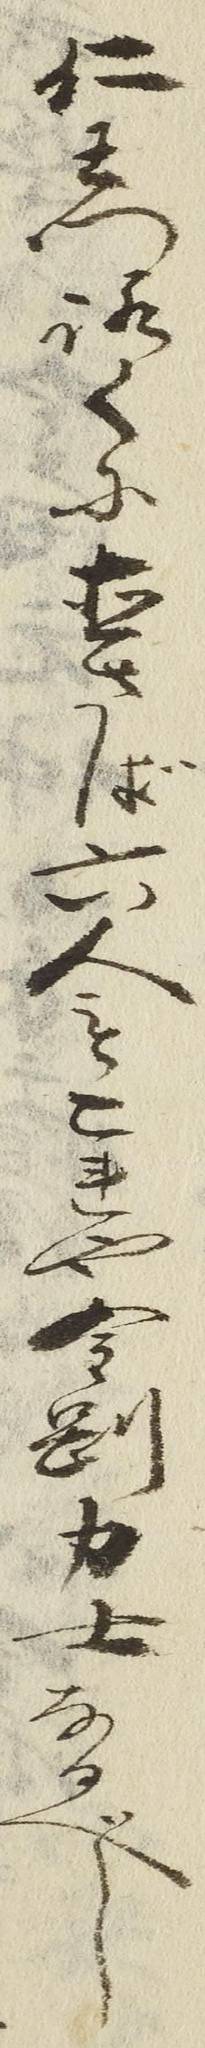仁王門ろくに直さば六人もこれや金剛力士なるべし
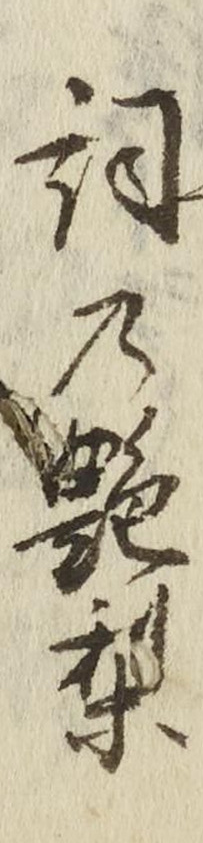詞乃艶梨
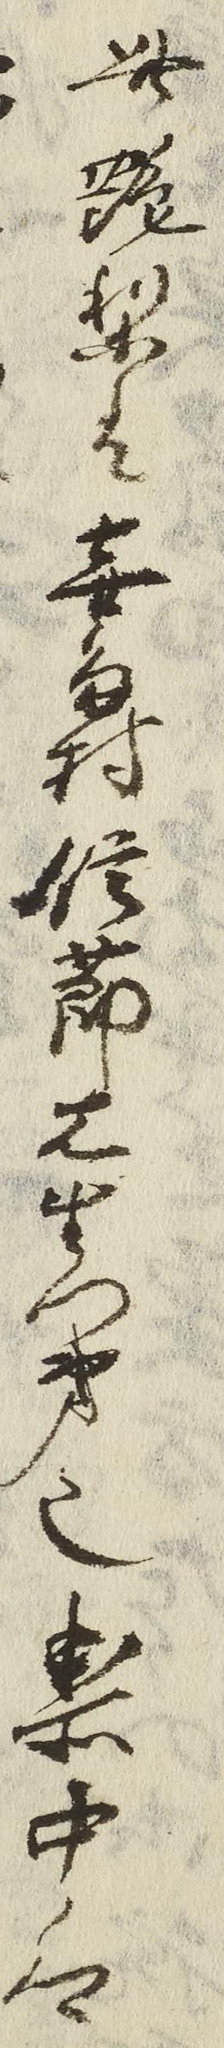此艶梨は喜多村信郎右衛門弟也本所中ノ郷
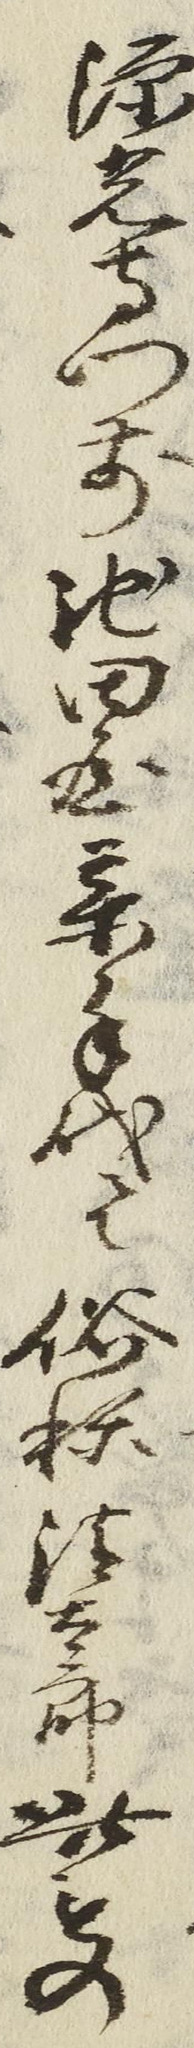源光寺門前池田屋某手代ニて俗称清太郎此もの
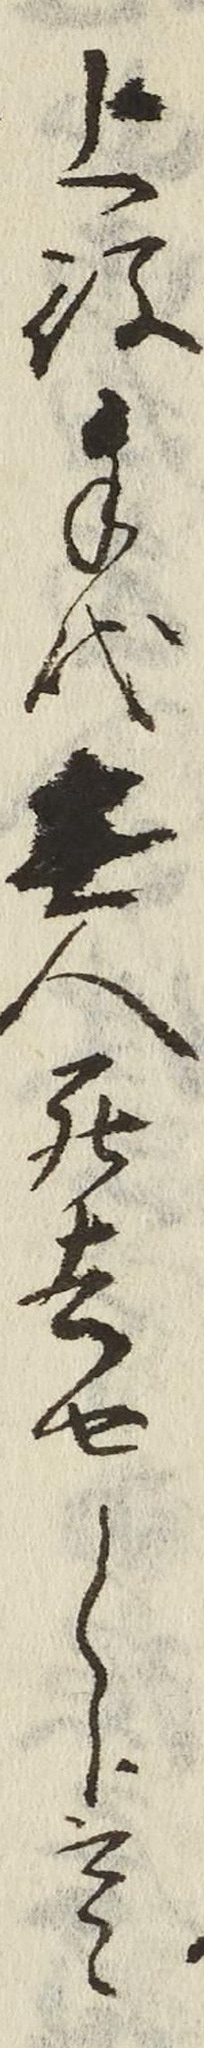上役手代壱人死去せしト云々
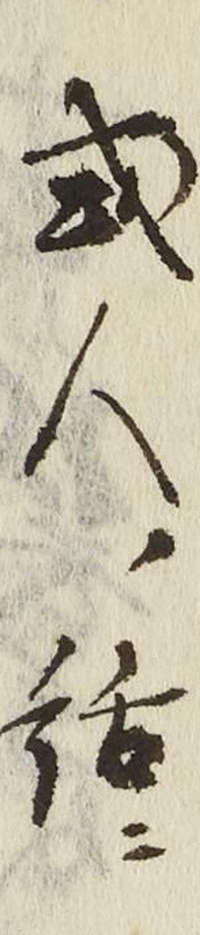或人ノ話ニ
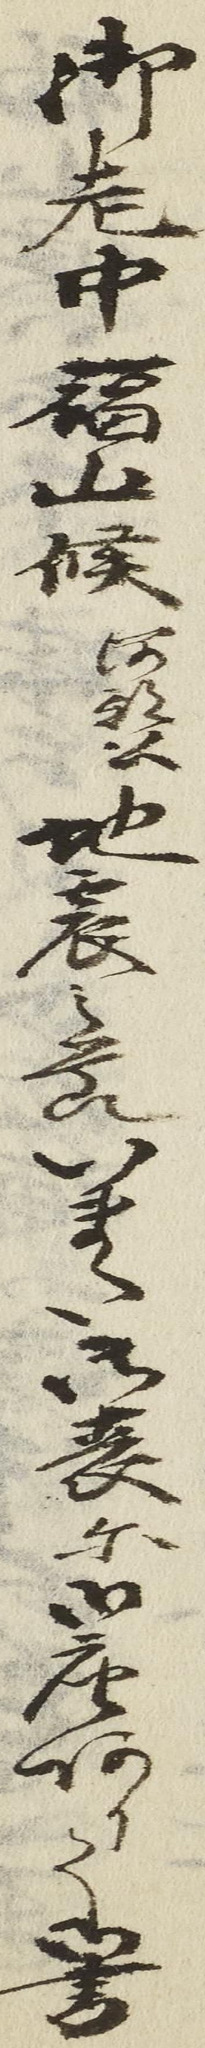御老中福山侯阿部公地震之節いまた御表に御座ありて御書
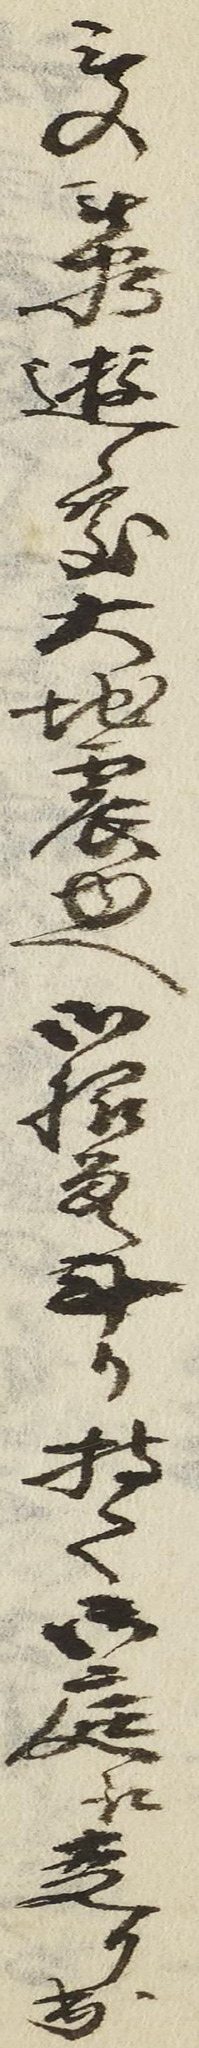もの被為遊候処大地震ゆへ御脇差計り持て御庭江走り出
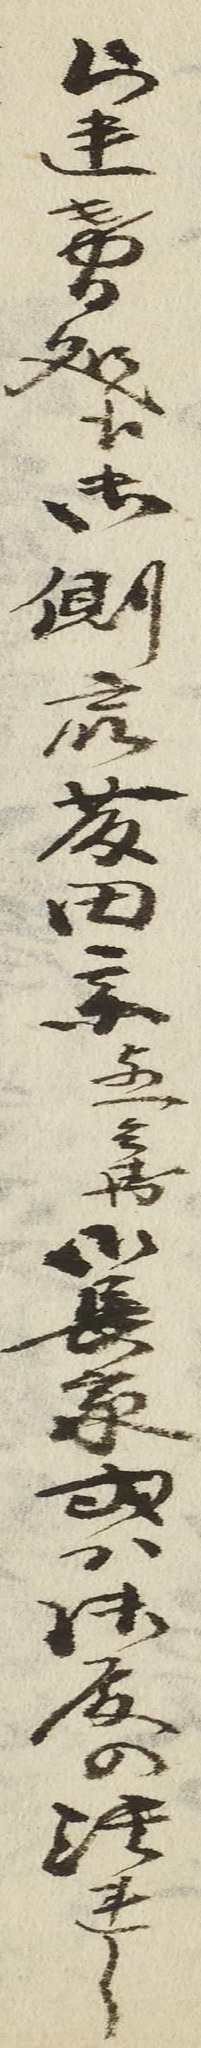られける所江御側衆藤田某与一兵衛御長家或は御殿の潰れし
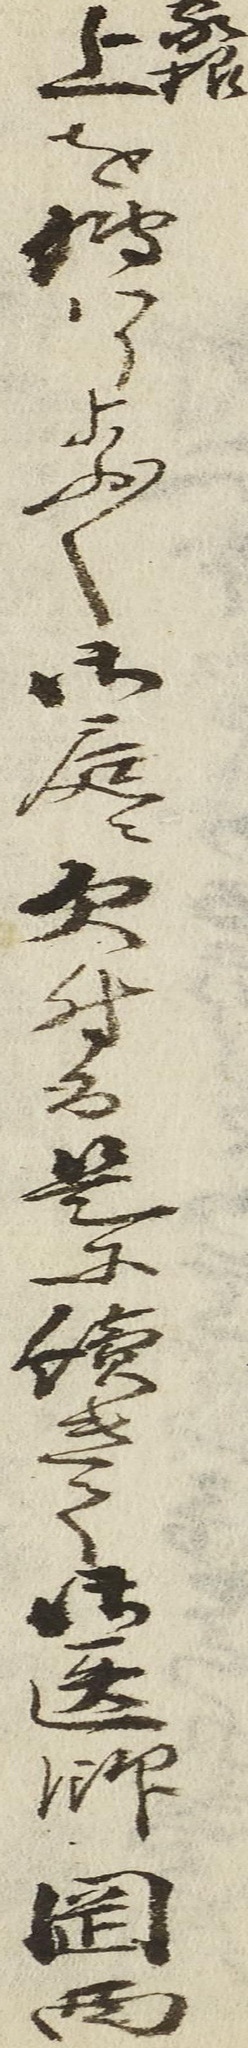上家根を伝はりよふ〳〵御庭ニ欠付る是に続きて御医師岡西
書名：安政二年震災記事　完
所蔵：東京大学地震研究所図書室 Earthquake Research Institute Library, The University of Tokyo, JAPAN
